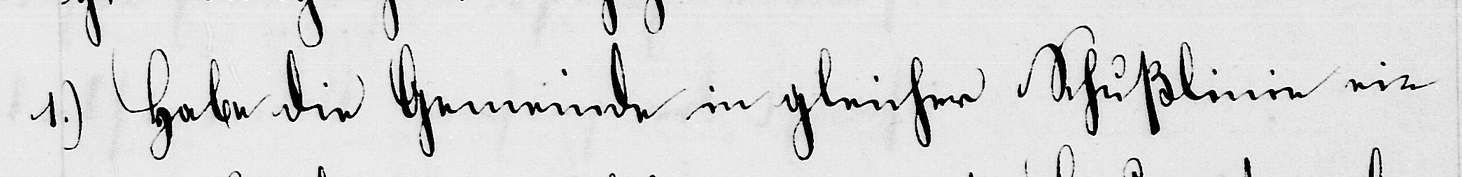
1.) Habe die Gemeinde in gleicher Schußlinie ei¬
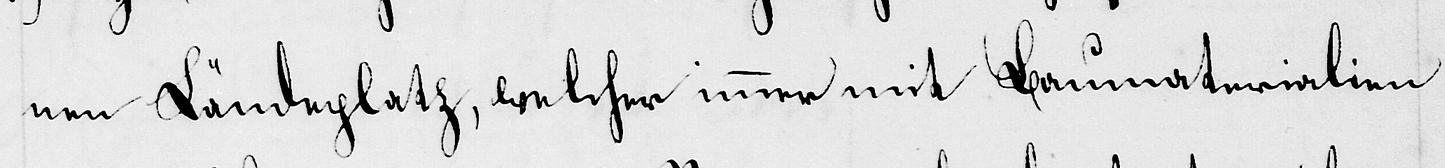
nen Ländeplatz, welcher immer mit Baumaterialien
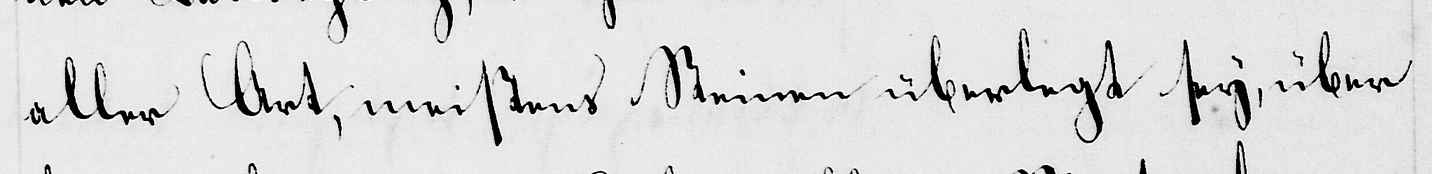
aller Art, meistens Steinen überlegt sey, über
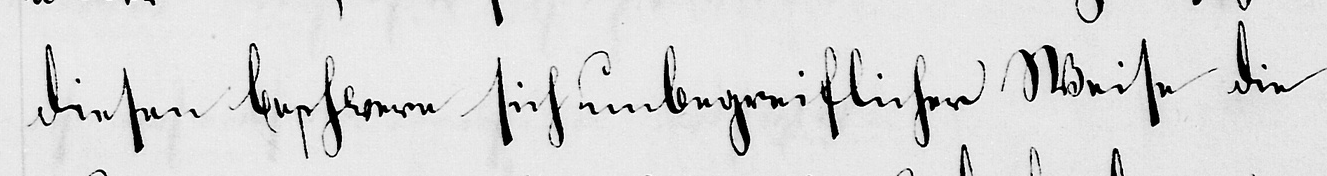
diesen beschwere sich unbegreiflicher Weise die
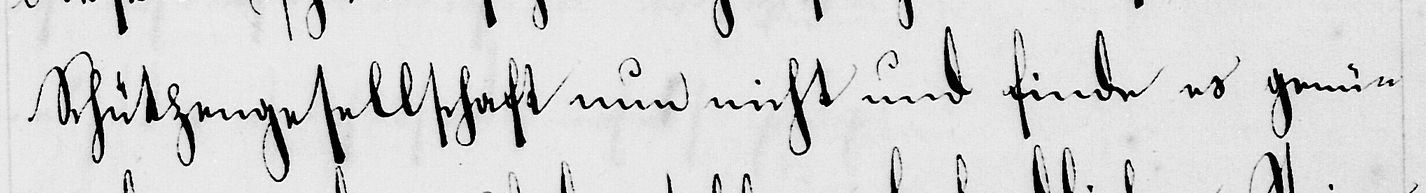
Schützengesellschaft nun nicht und finde es genü¬
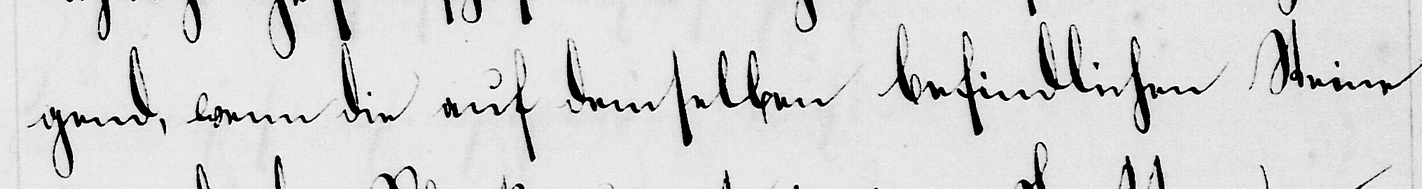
gend, wenn die auf demselben befindlichen Steine
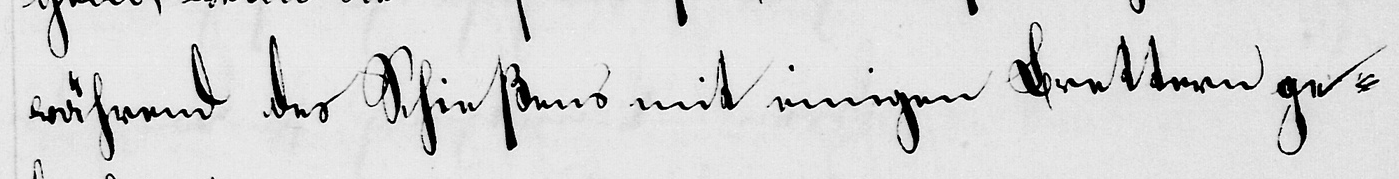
während des Schießens mit einigen Brettern ge¬
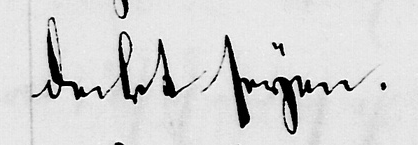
deckt seyen.
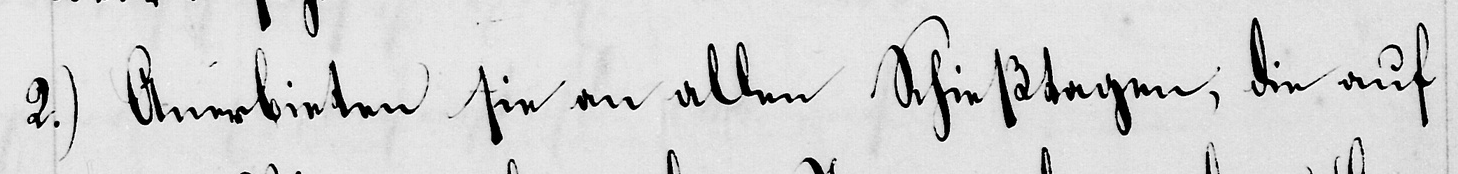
2.) Anerbieten sie an allen Schießtagen, die auf
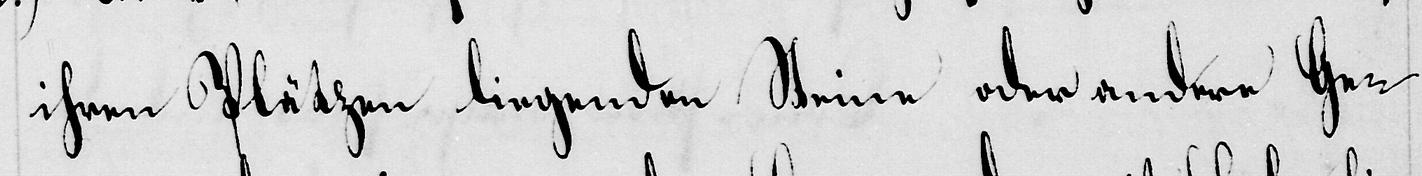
ihren Plätzen liegenden Steine oder andere Ge¬
